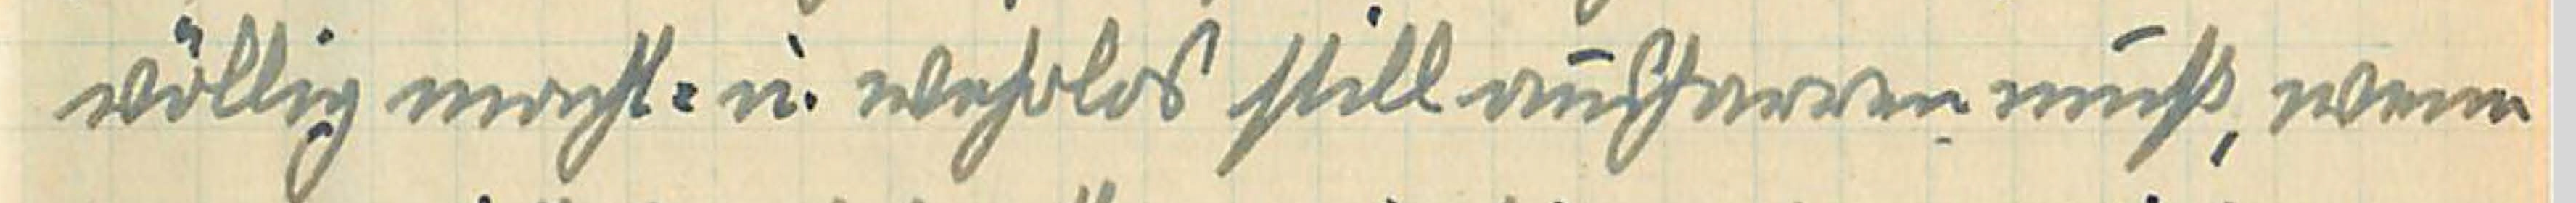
völlig macht- u. wehrlos still ausharren muß, wenn
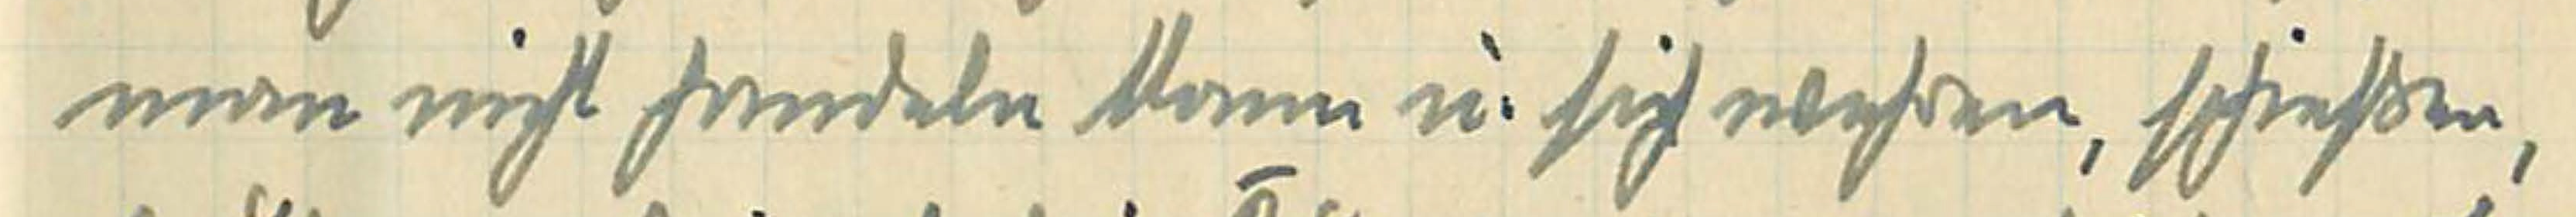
man nicht handeln kann u. sich wehren, schießen,
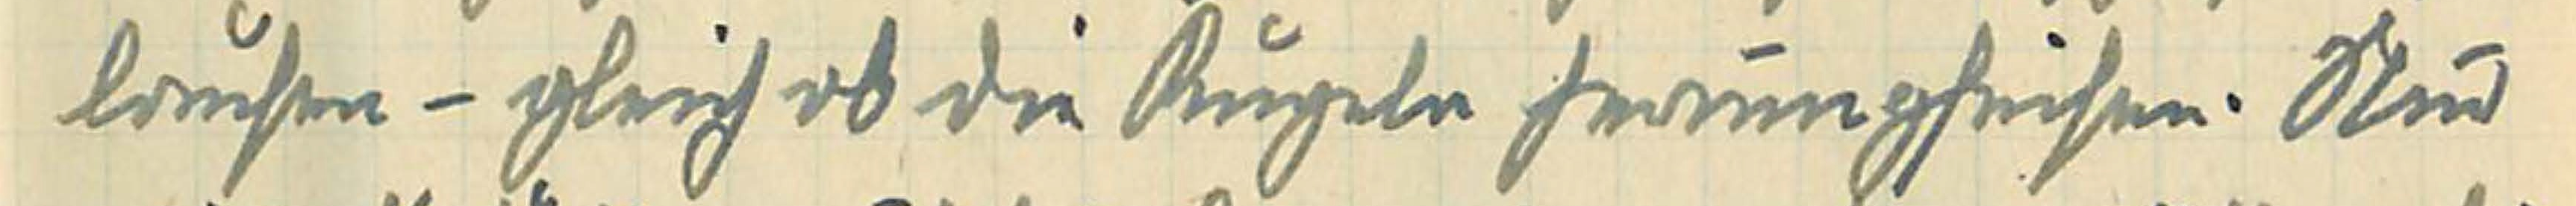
laufen – gleich ob die Kugeln herumpfeifen. Nur
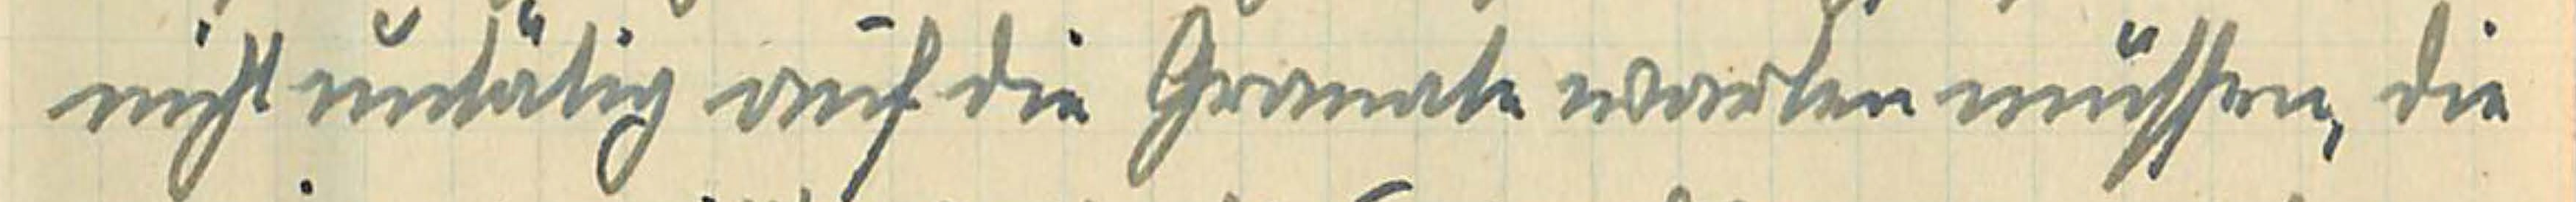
nicht untätig auf die Granate warten müssen, die
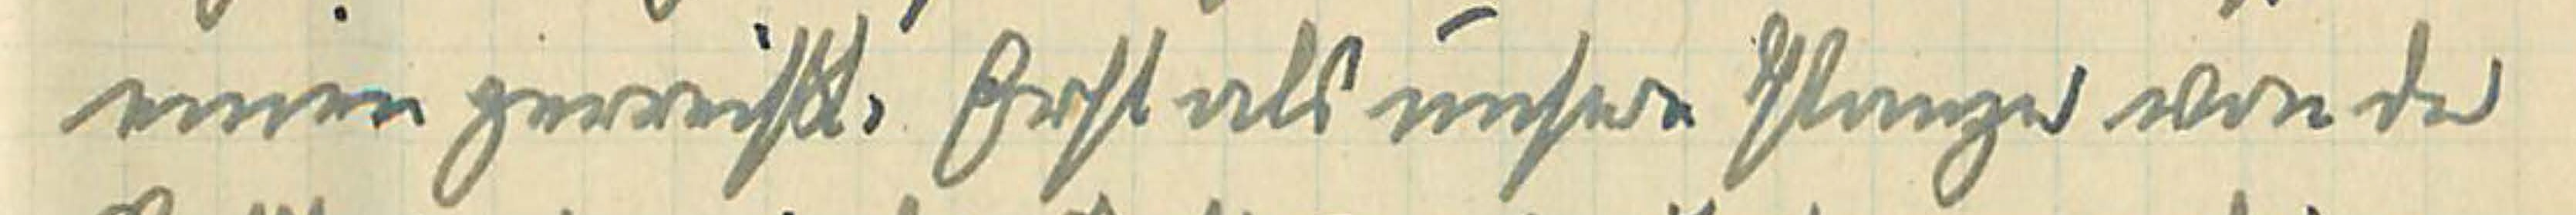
einen zerreißt. Erst als unsere Panzer von der
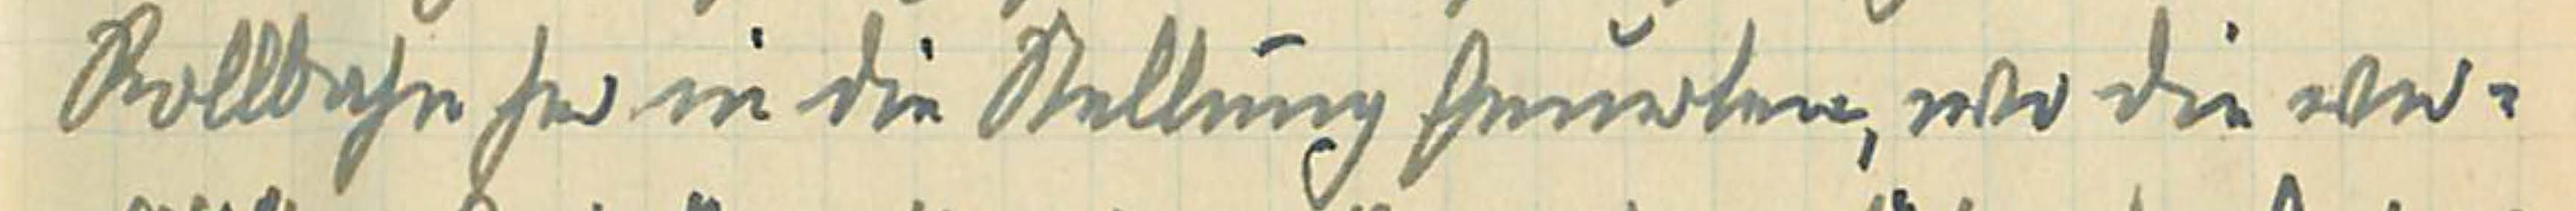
Rollbahn her in die Stellung feuerten, wo die ver-
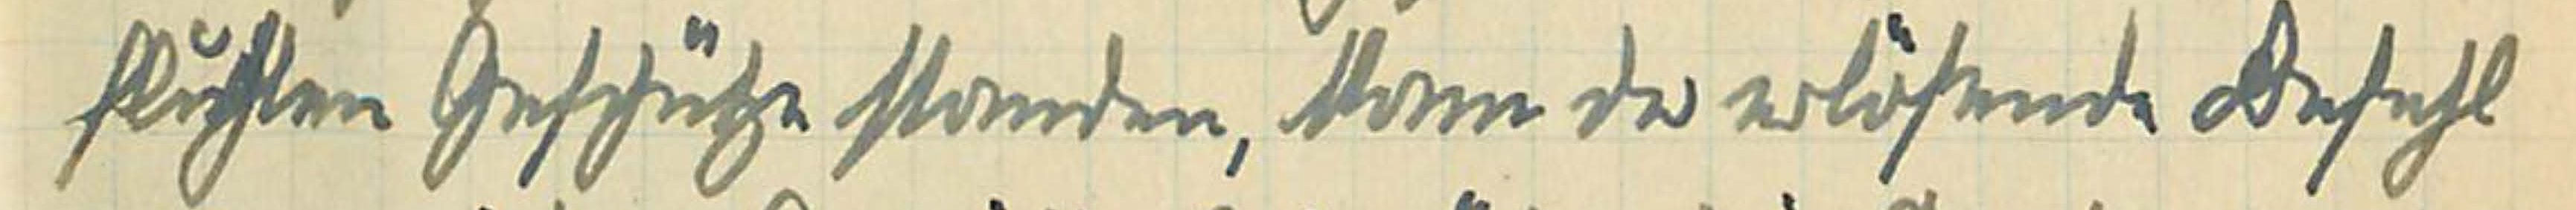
fluchten Geschütze standen, kam der erlösende Befehl
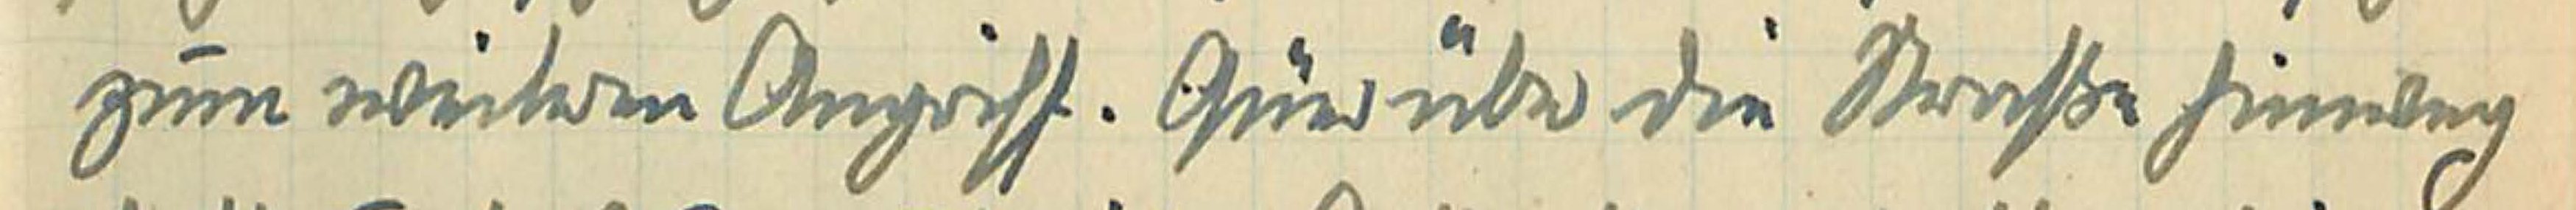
zum weiteren Angriff. Quer über die Straße hinweg
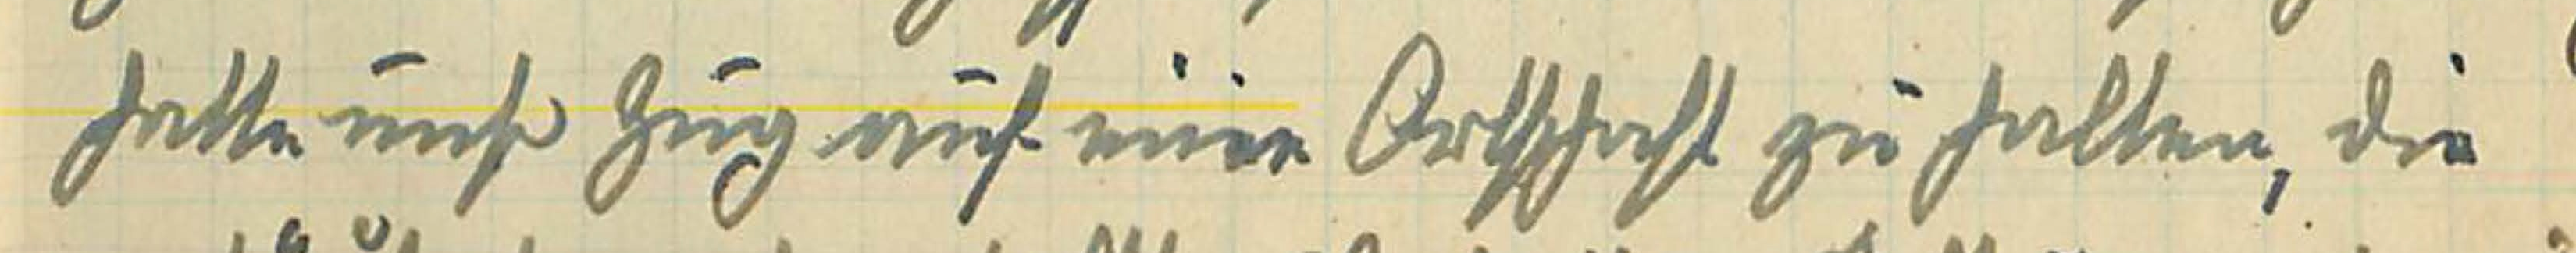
hatte unser Zug auf eine Ortschaft zu halten, die
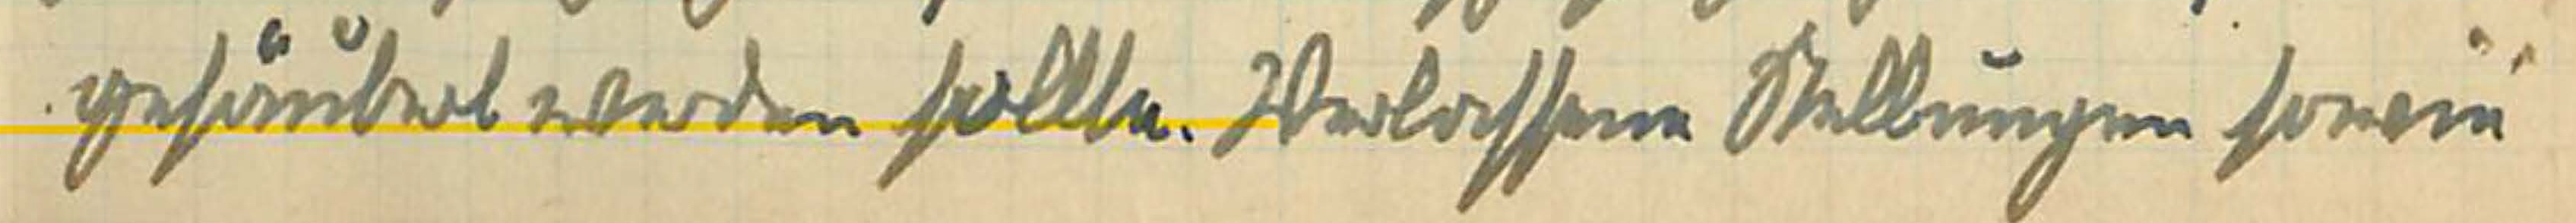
gesäubert werden sollte. Verlassene Stellungen sowie
